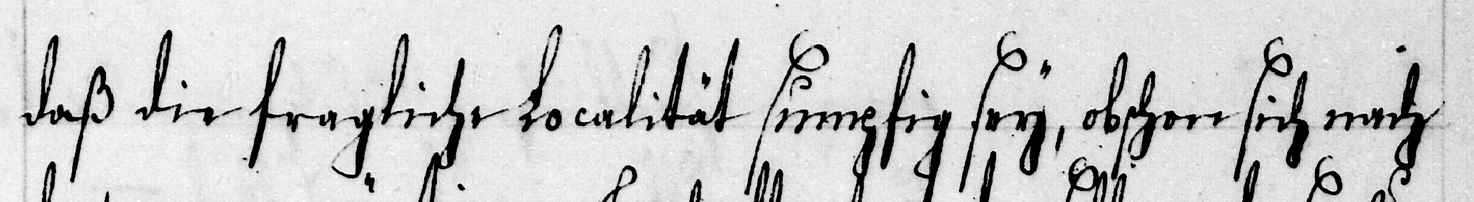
daß die fragliche Localität sumpfig sey, obschon sich
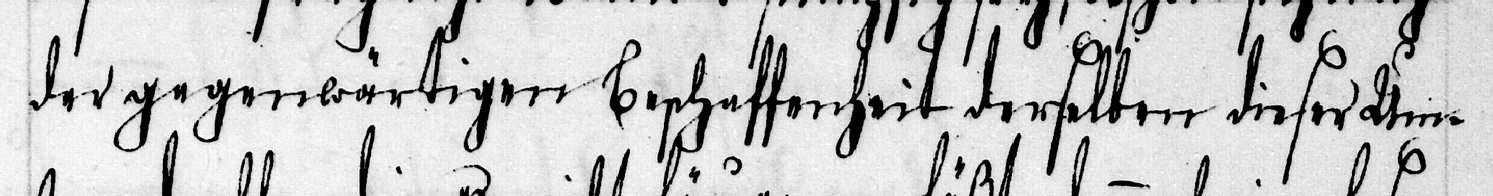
der gegenwärtigen Beschaffenheit derselben dieser Um¬
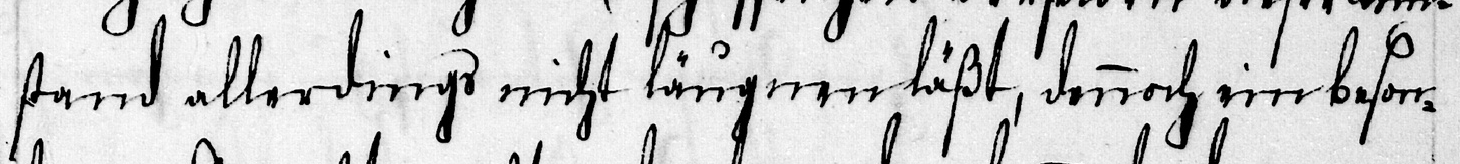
stand allerdings nicht läugnen läßt, dennoch ein beson¬
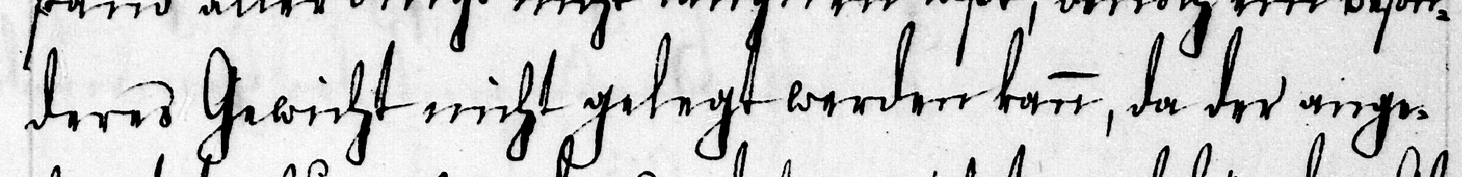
deres Gewicht nicht gelegt werden kann, da der ange¬
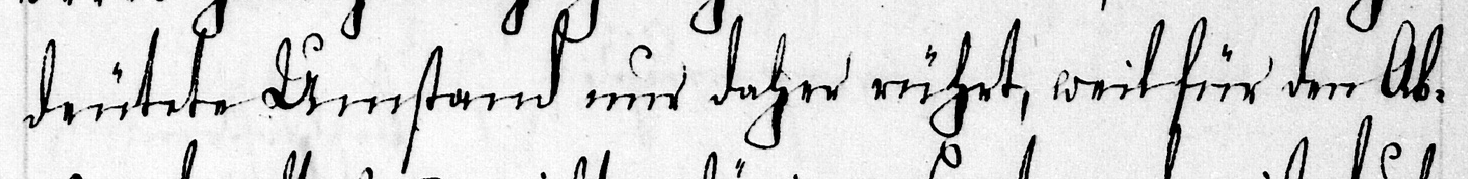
deutete Umstand nur daher rührt, weil für den Ab¬
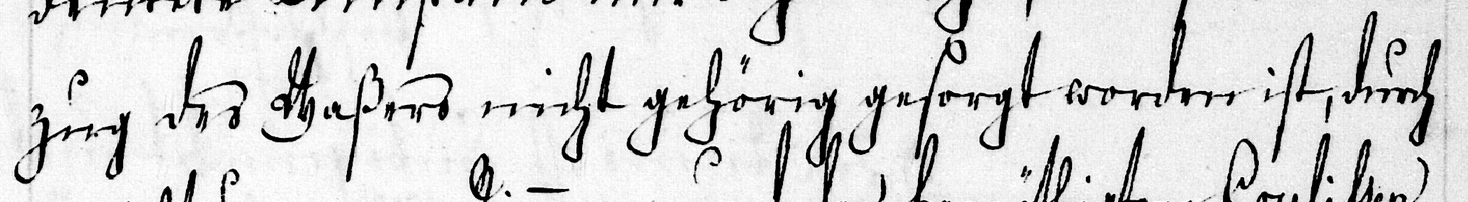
zug des Waßers nicht gehörig gesorgt worden ist, durch
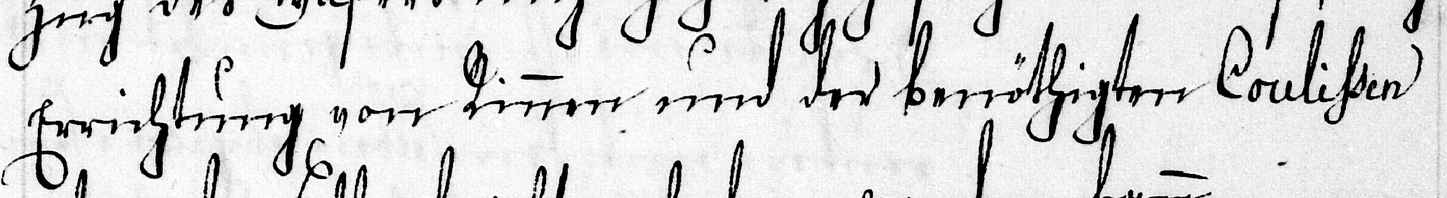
Errichtung von Rinnen und der benöthigten Coulissen
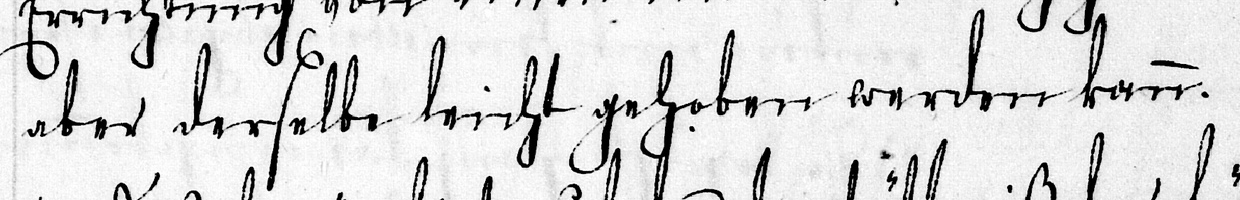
aber derselbe leicht gehoben werden kann.
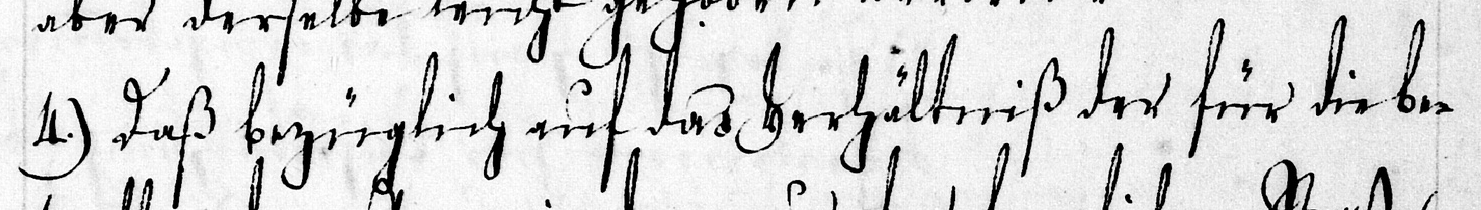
4.) Daß bezüglich auf das Verhältniß der für die be¬
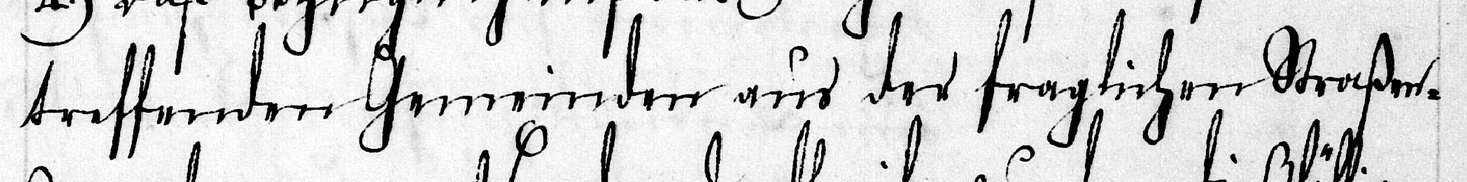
treffenden Gemeinden aus der fraglichen Straße¬
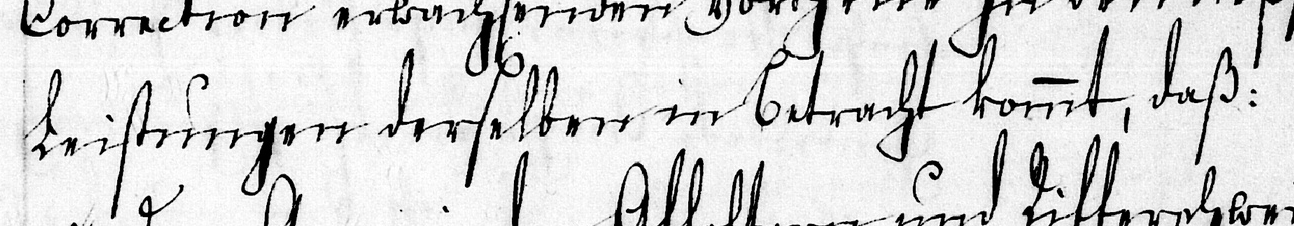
Leistungen derselben in Betracht kommt, daß:
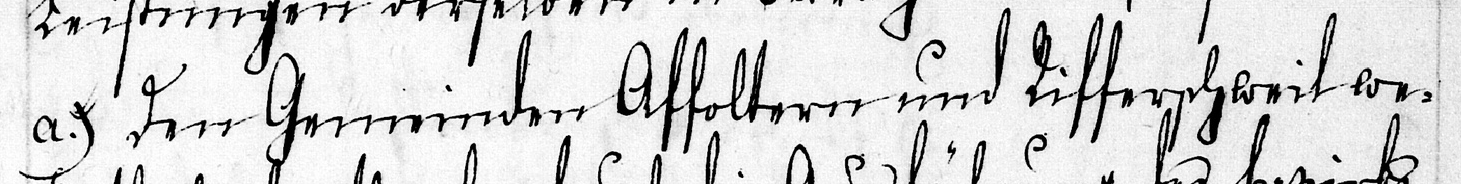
a.) Den Gemeinden Affoltern und Rifferschweil we¬
